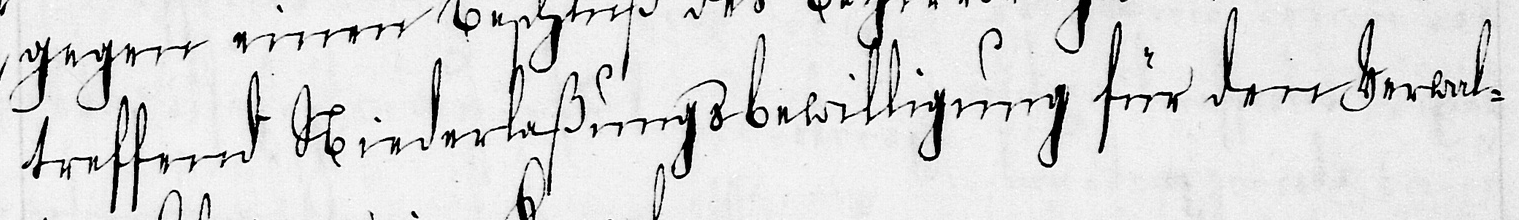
treffend Niederlaßungsbewilligung für den Verwal¬
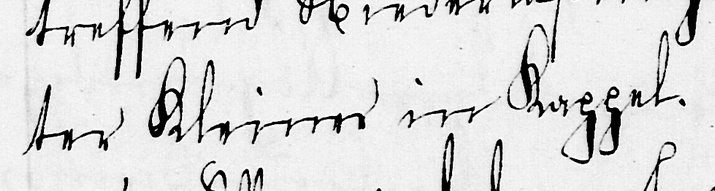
ter Kleiner in Kappel
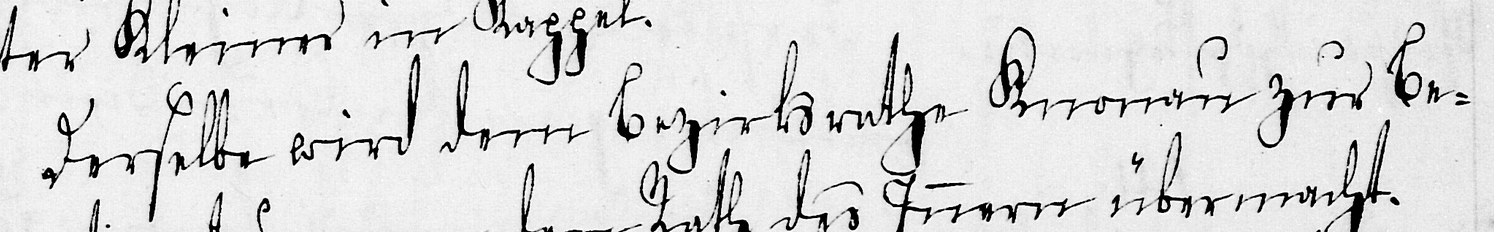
Derselbe wird dem Bezirksrathe Knonau zur Be¬
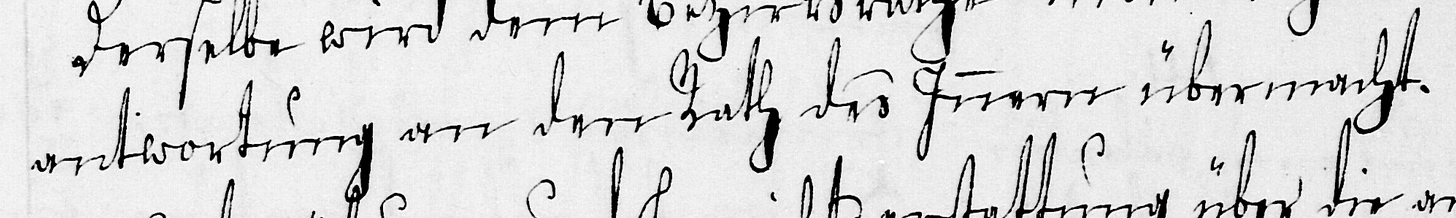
antwortung an den Rath des Innern übermacht.
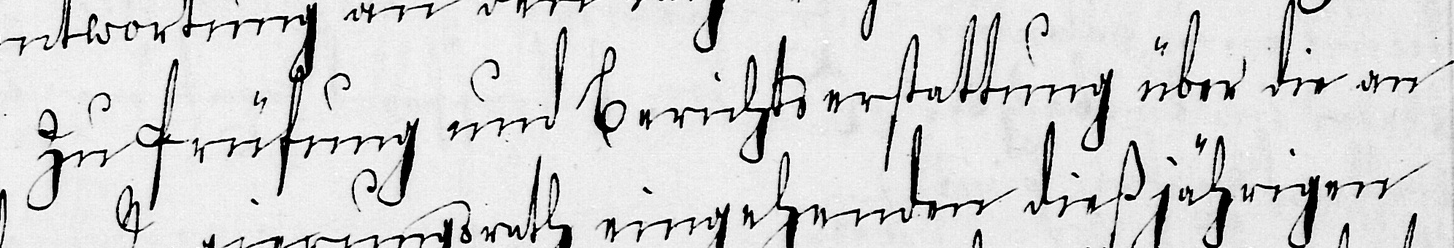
Zu Prüfung und Berichtserstattung über die an
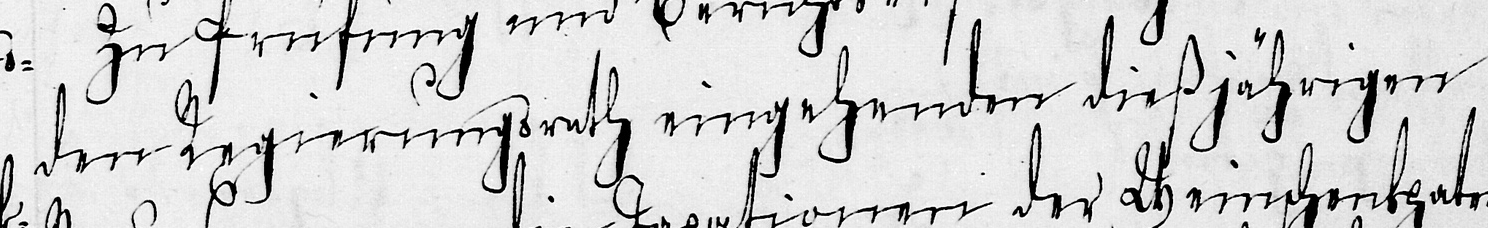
den Regierungsrath eingehenden dießjährigen
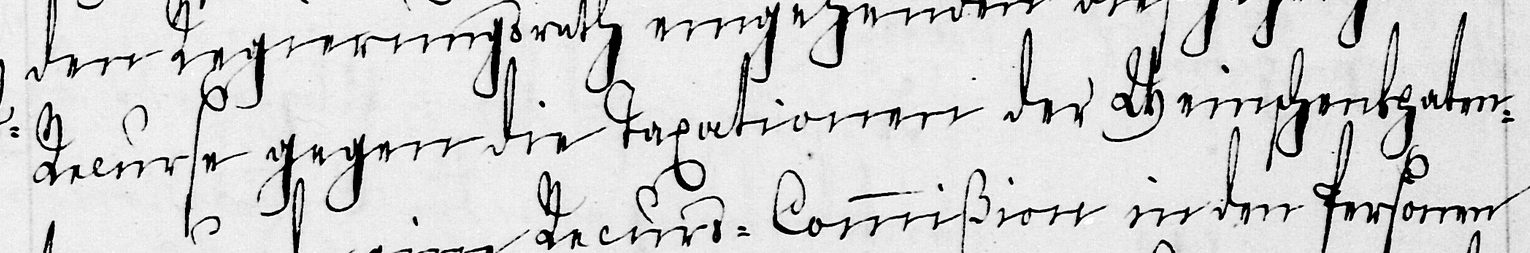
Recurse gegen die Taxationen der Weinschenkpaten¬
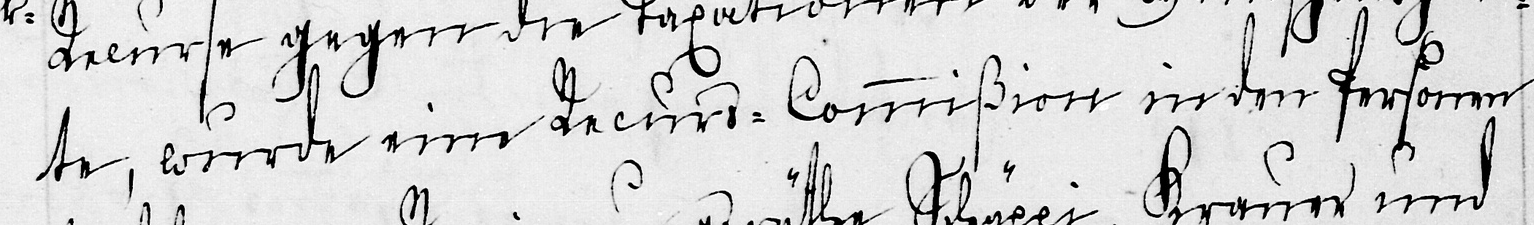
te, wurde eine Recurs-Commißion in den Personen
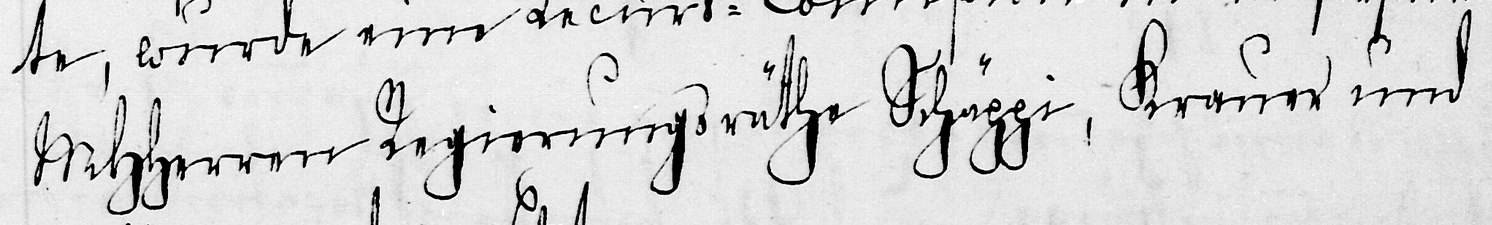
MHHerren Regierungsräthe Schäppi, Krauer und
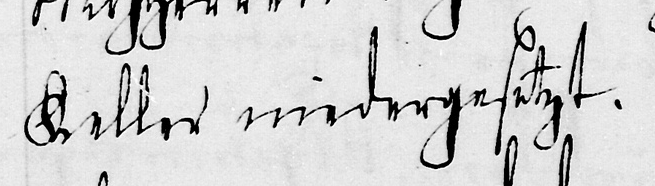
Keller niedergesetzt.
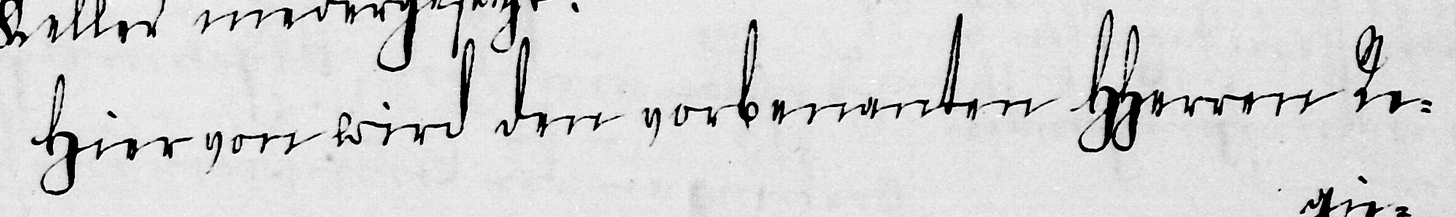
Hiervon wird den vorbenanten HHerren Re-
